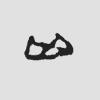凶
